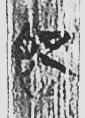即
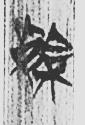殜
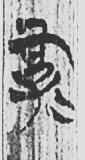乳=
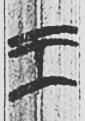王
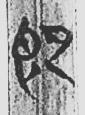即
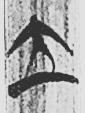立
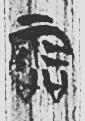霝
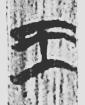王
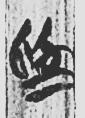爲
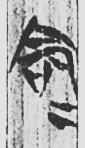命=
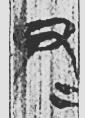尹=
